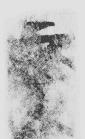不
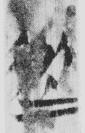從
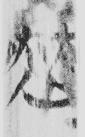勞
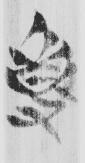事
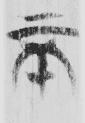不
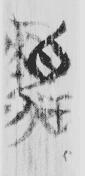{來耒田}
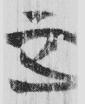正
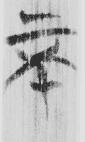不
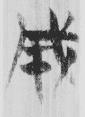成
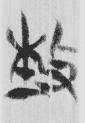{坴攴}
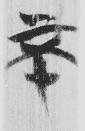不
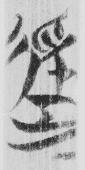{辶㸒}
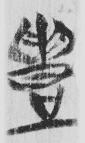豊
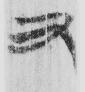又
